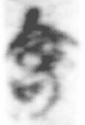宰
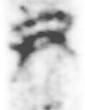尹
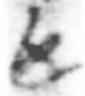臣
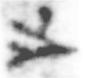之
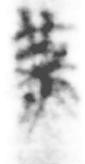黃
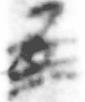爲
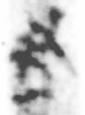○（右）
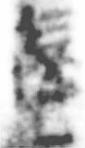○（服）
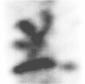之
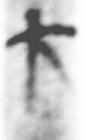大
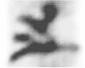之
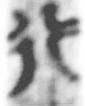行
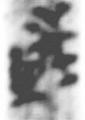○（廣）
